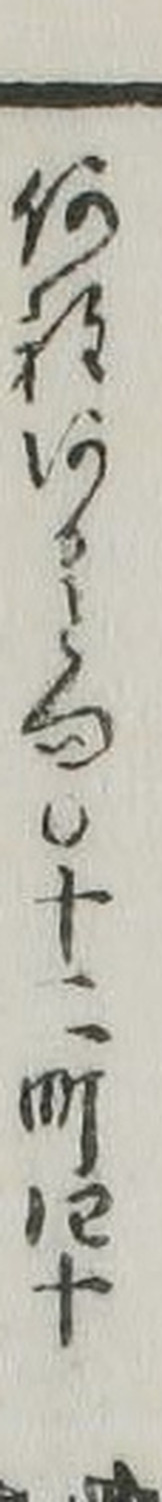何程あると問○十二町四十
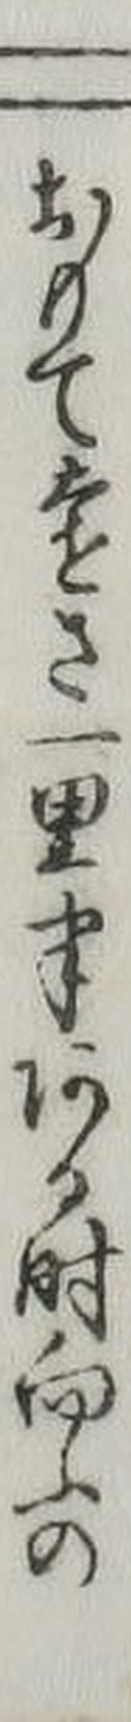おもて遠さ一里半ある時向ふの
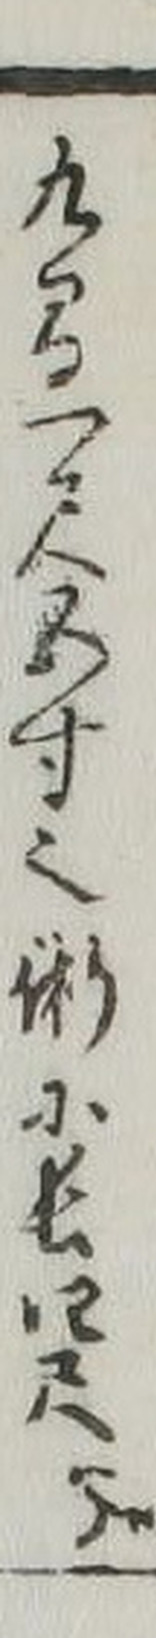九間一尺五寸也術に長四尺
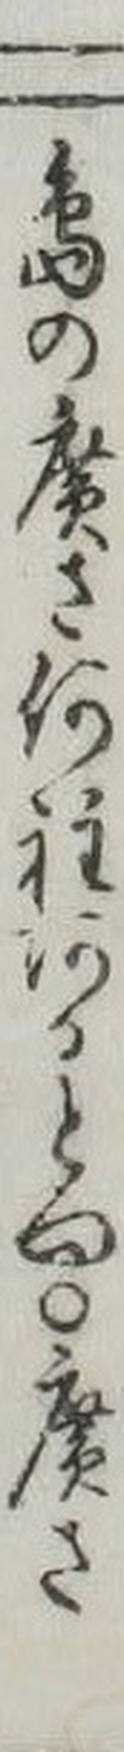島の広さ何程あると問○広さ
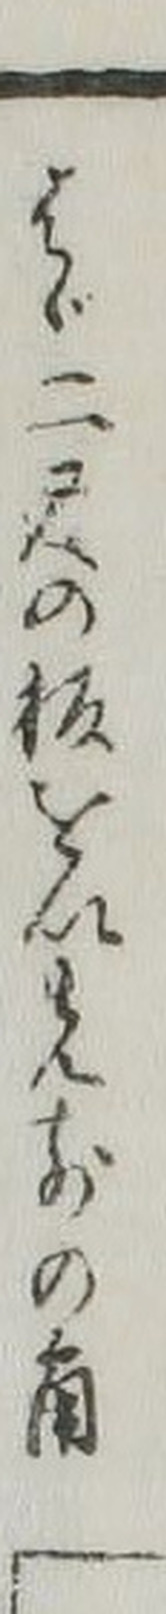はゞ二間の板を以先前の角
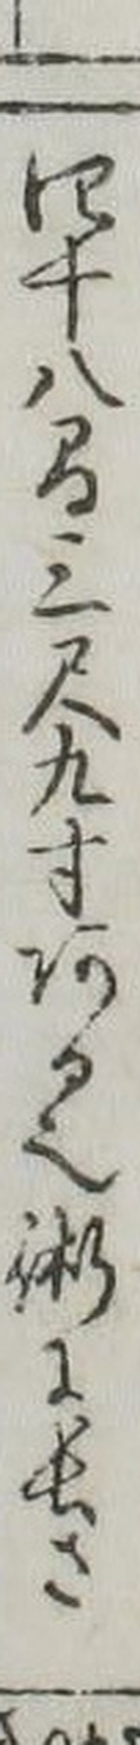四十八間三尺九寸ある也術に長さ
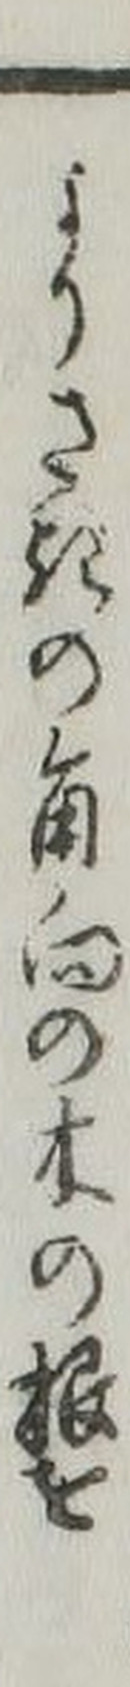よりさきの角向の木の根を
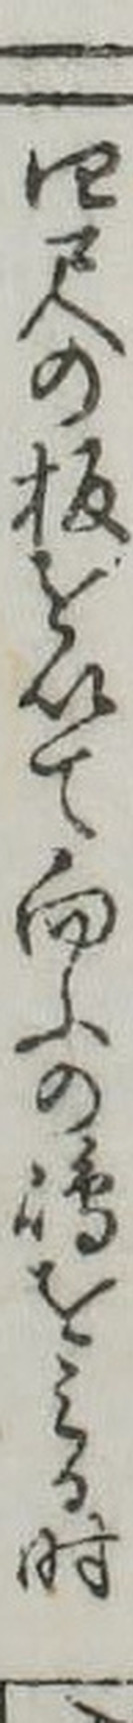四尺の板を以て向ふの島をみる時
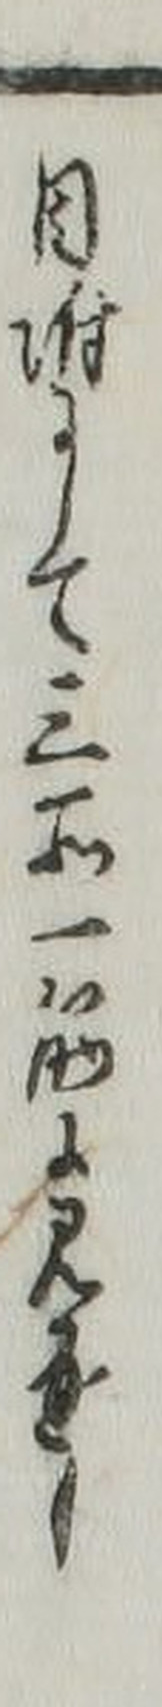目附にして三所一筋に見通し
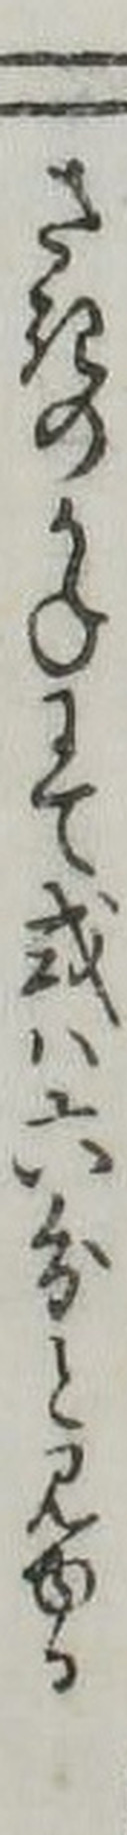さきのかねにて或は六分と見ゆる
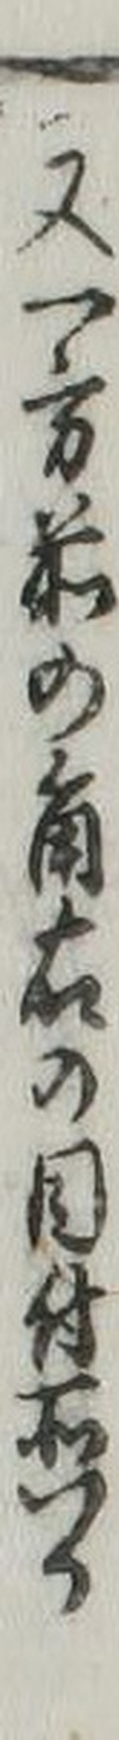又一方前の角右の目付所いか
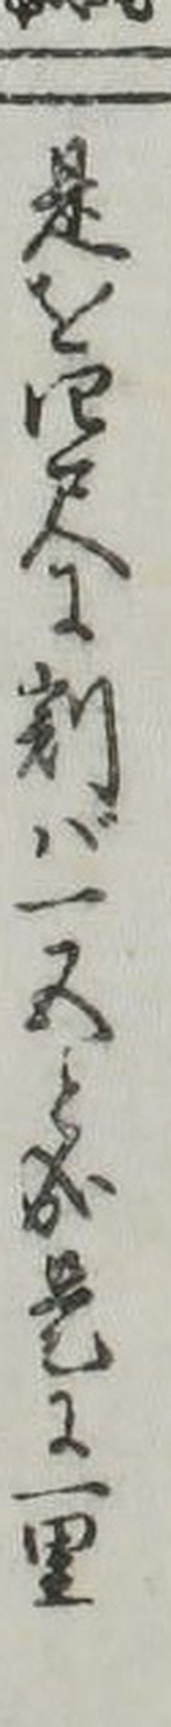是を四尺に割ば一五と成是に一厘
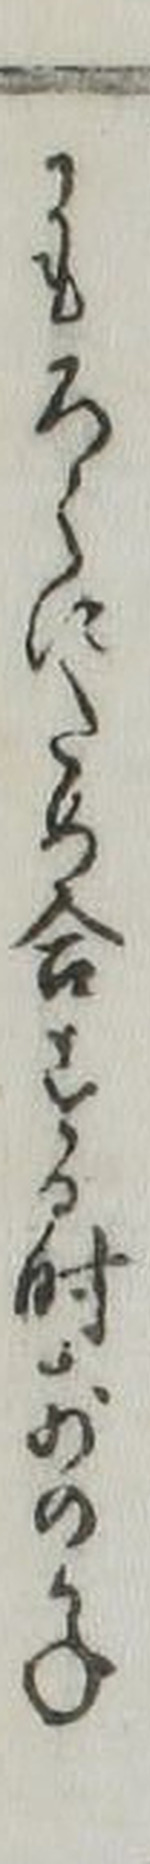にもろくにため合する時前のかね
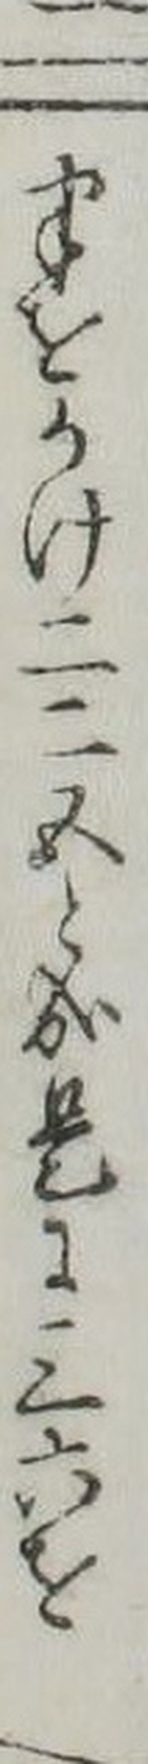半をかけ二二五と成是に三六を
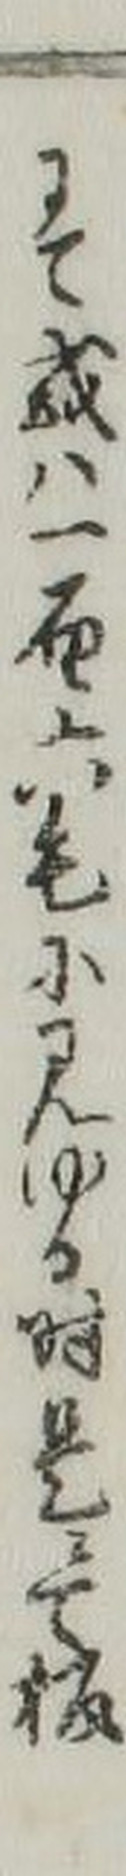にて或は一厘六毛に見ゆる時是にて板
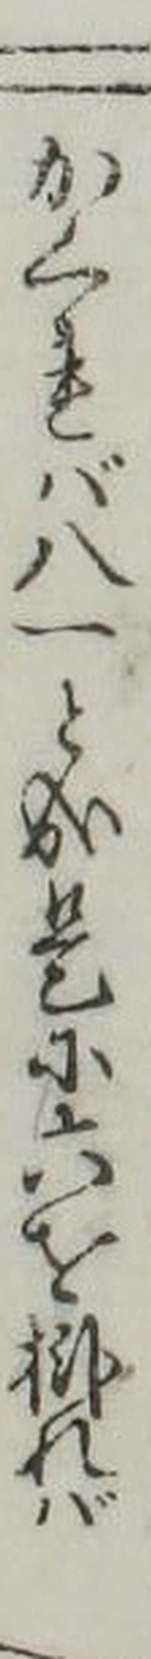かくれば八一と成是に六を掛れば
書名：宝玉塵劫記
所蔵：東京学芸大学教育コンテンツアーカイブ
